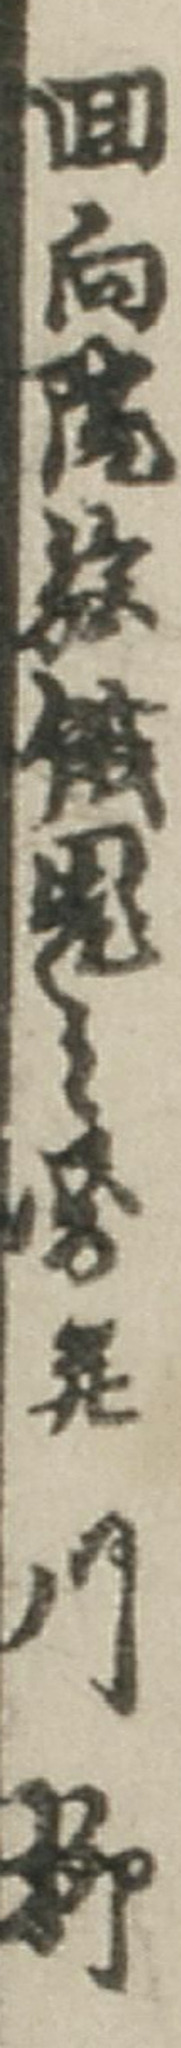回向院施餓鬼之図并川柳
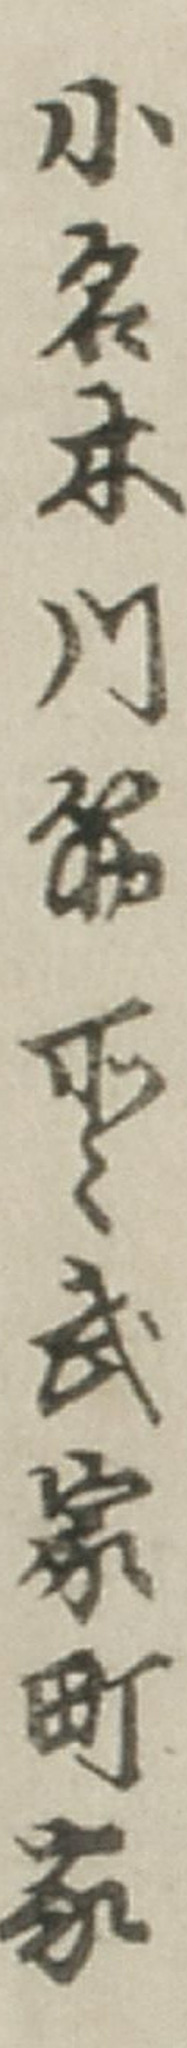小名木川筋所〻武家町家
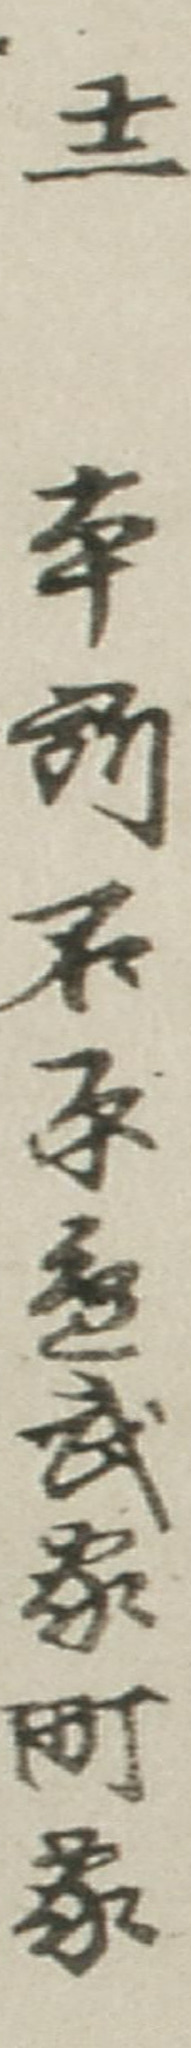十二本所石原辺武家町家
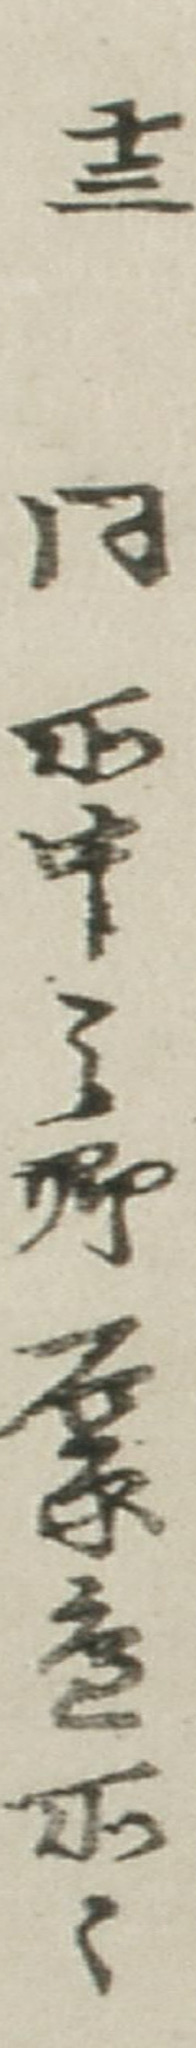十三同所中之郷石原辺所〻
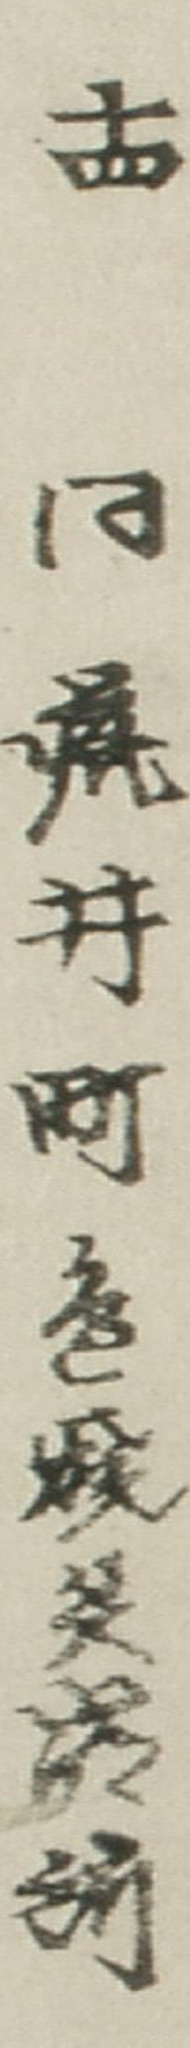十四同荒井町辺焼失崩所
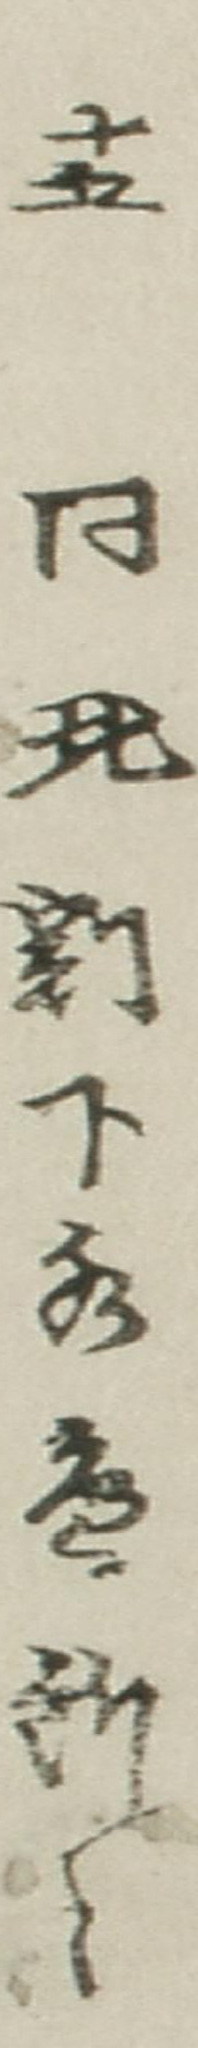十五同北割下水辺所〻
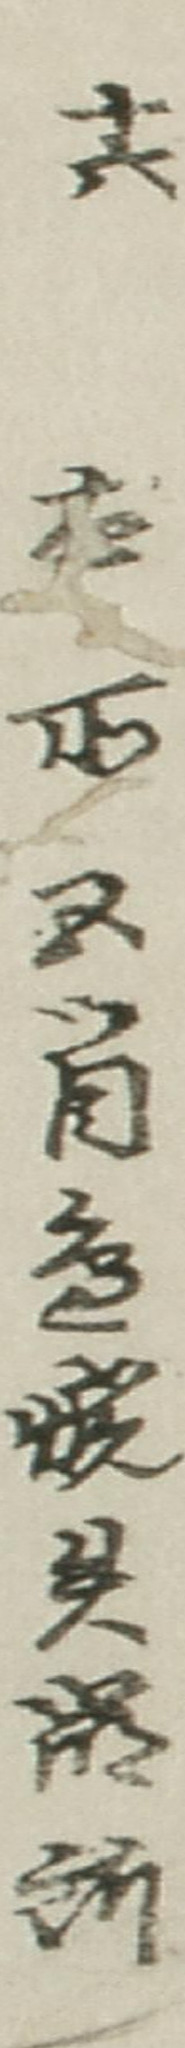十六本所五ツ目辺焼失崩所
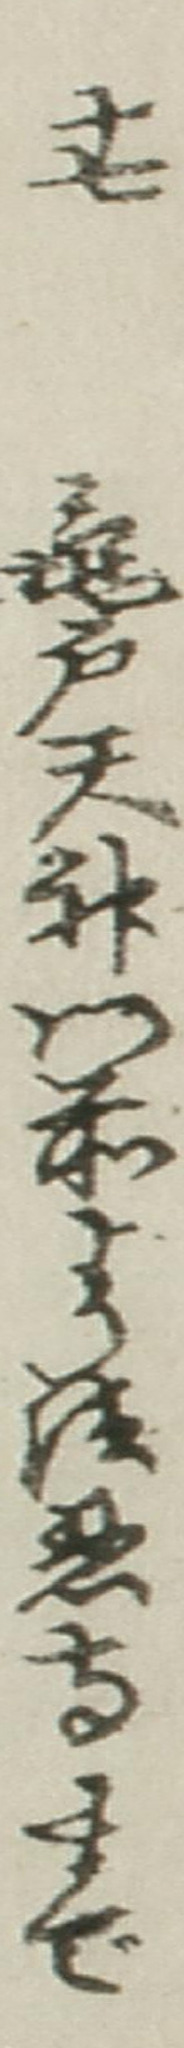十七亀戸天神門前より法恩寺まで
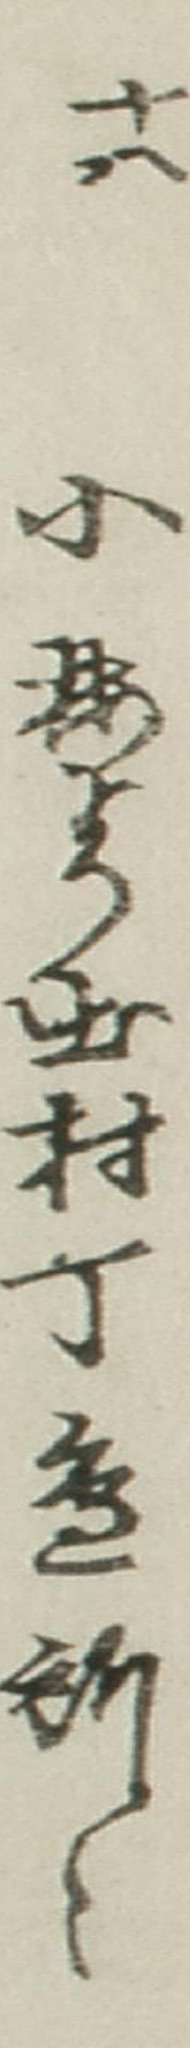十八小梅より出村丁辺所〻
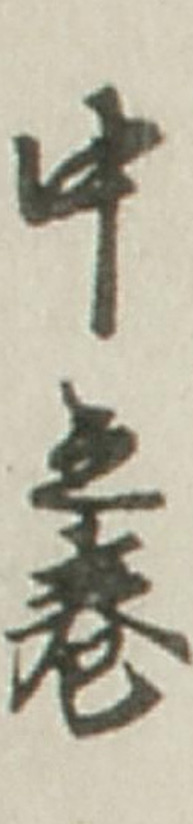中之巻
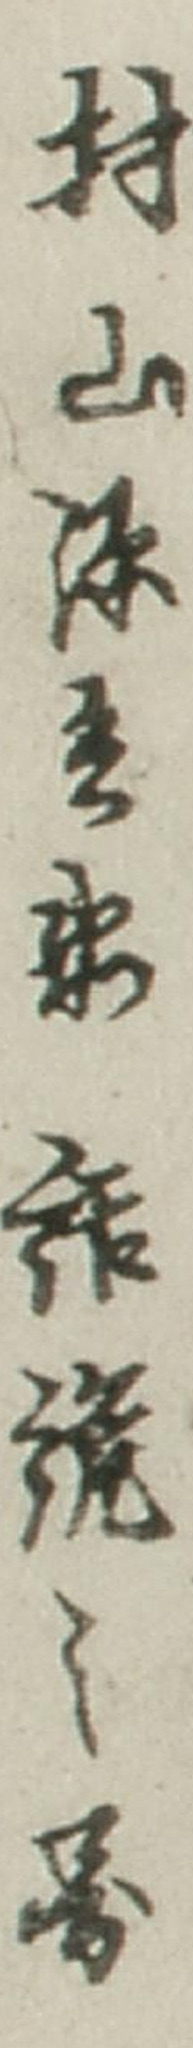村山源兵衛話説之図

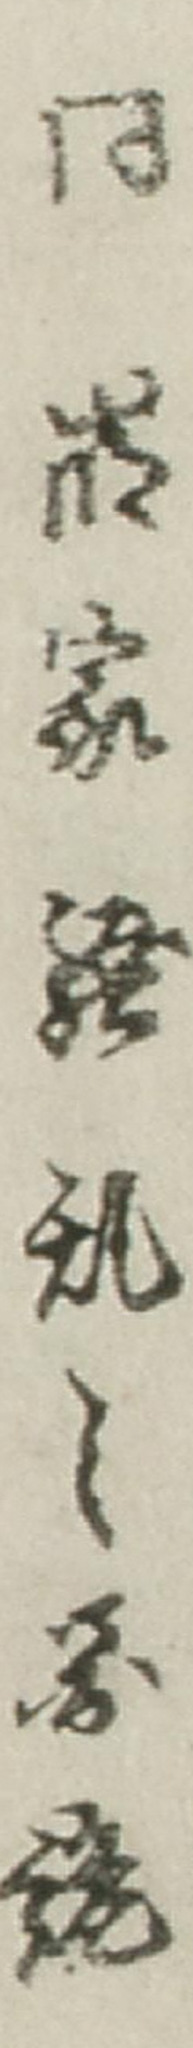同崩家騒乱之図説
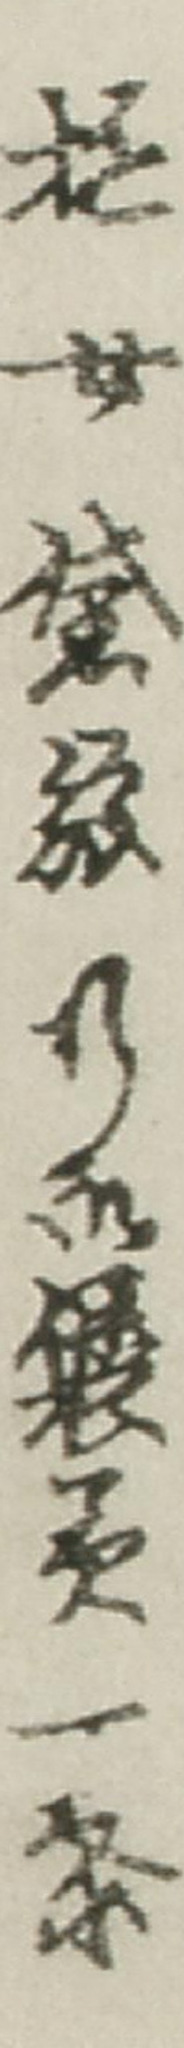遊女黛施行御褒美一条
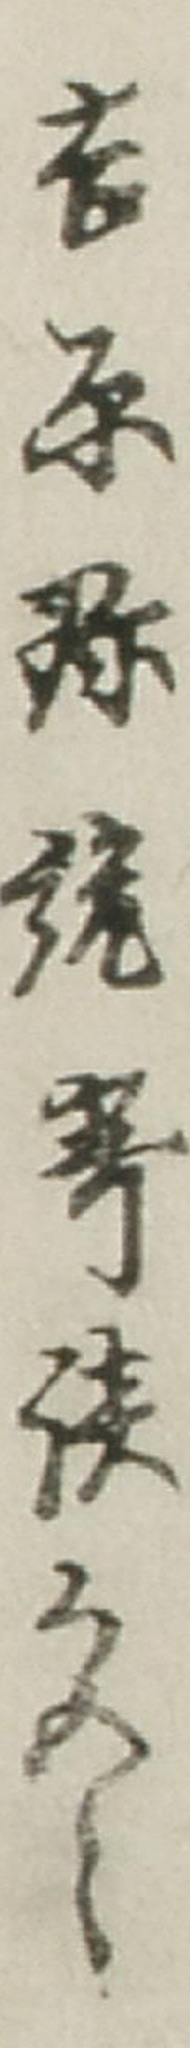吉原珍説寄談色〻
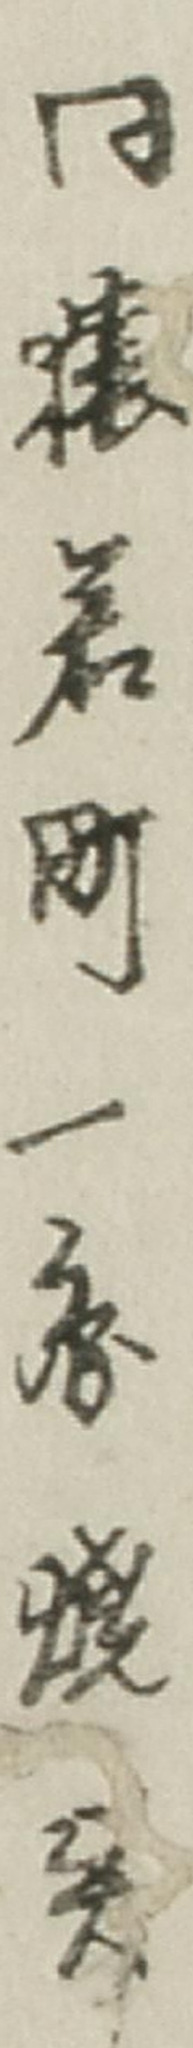廿五同猿若丁一円焼失
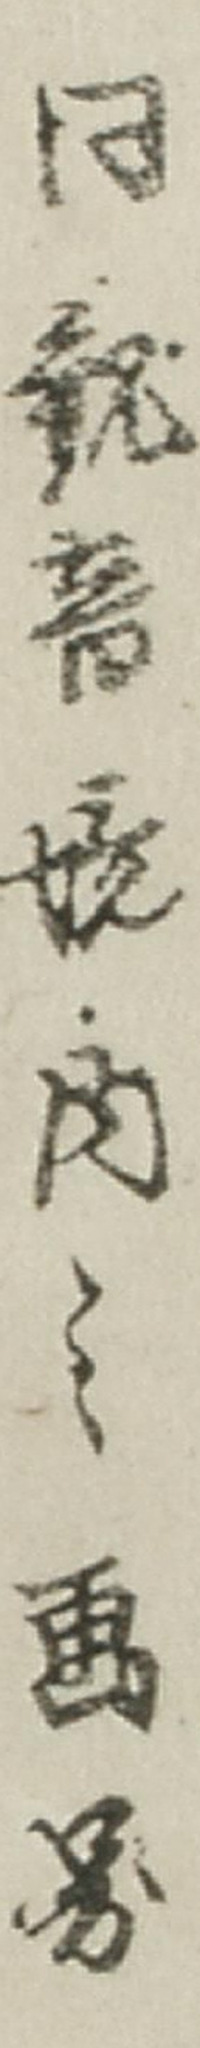同観音境内之画図
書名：安政見聞誌　上
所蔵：東京大学地震研究所図書室 Earthquake Research Institute Library, The University of Tokyo, JAPAN
